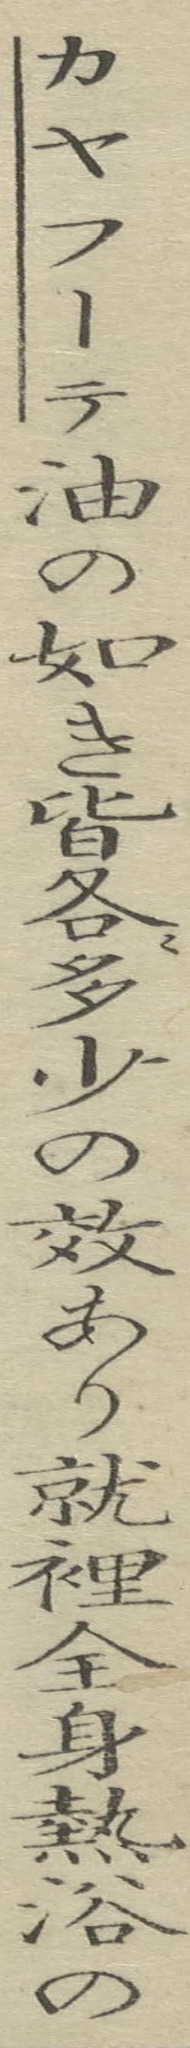カヤフーテ油の如き皆各多少の効あり就裡全身熱浴の
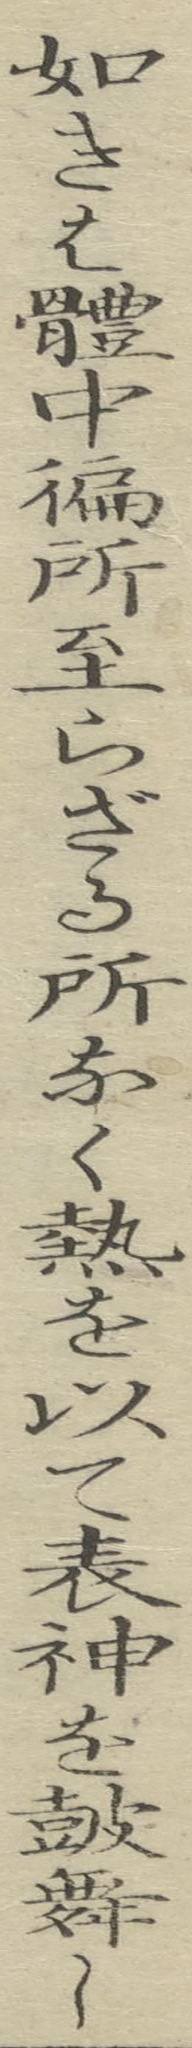如きは體中徧所至らざる所なく熱を以て表神を鼓舞し
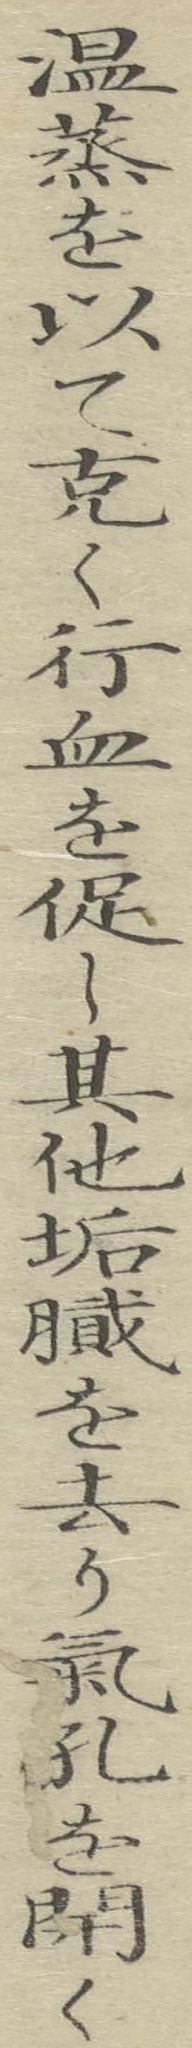温蒸を以て克く行血を促し其他垢膩を去り氣孔を開く
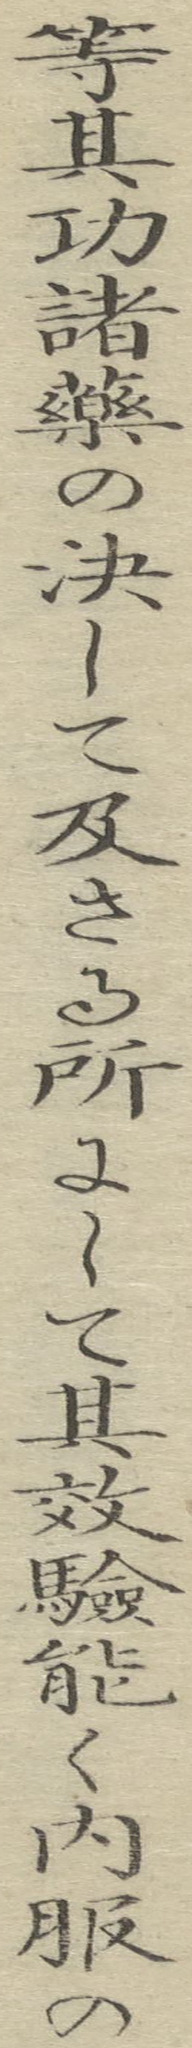等其功諸藥の決して及さる所にして其効驗能く内服の
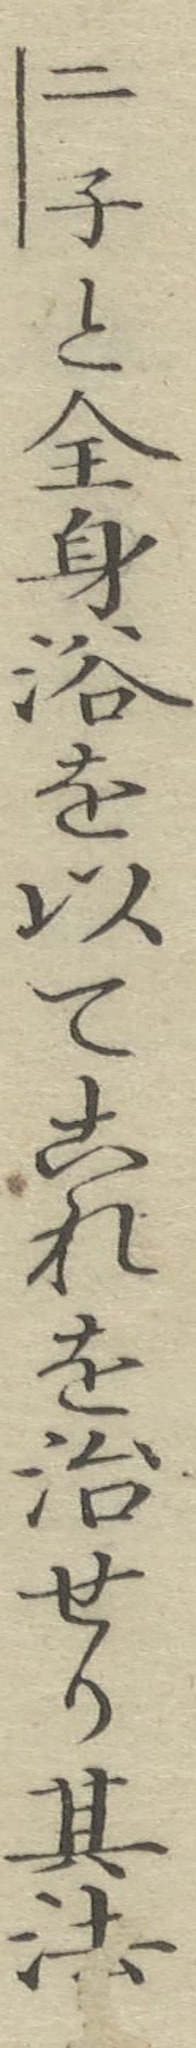ニネと全身浴を以てこれを治せり其法
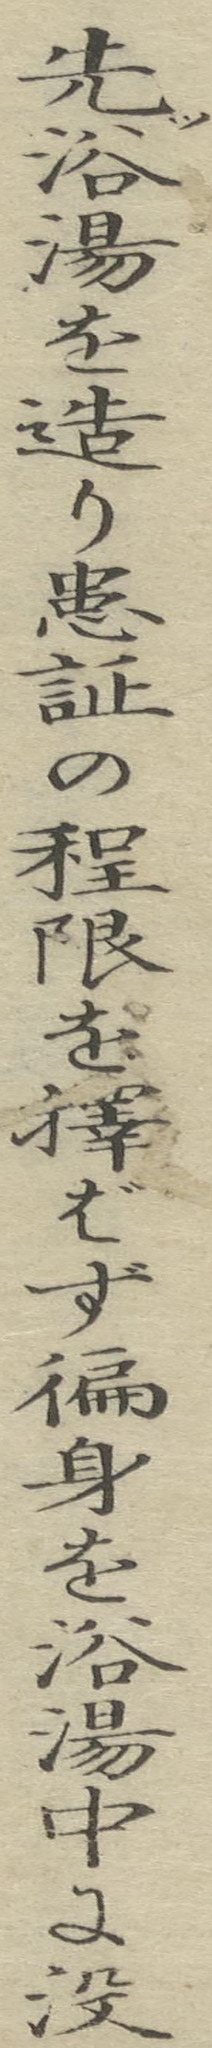先浴場を造り患証の程限を襗ばず徧身を浴場中に没
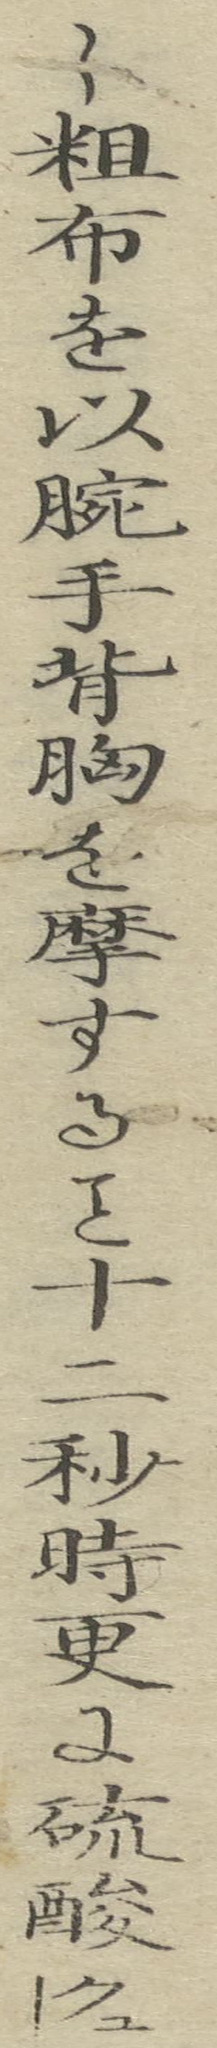し粗布を以腕手背胸を摩すること十二秒時更に硫酸クュ
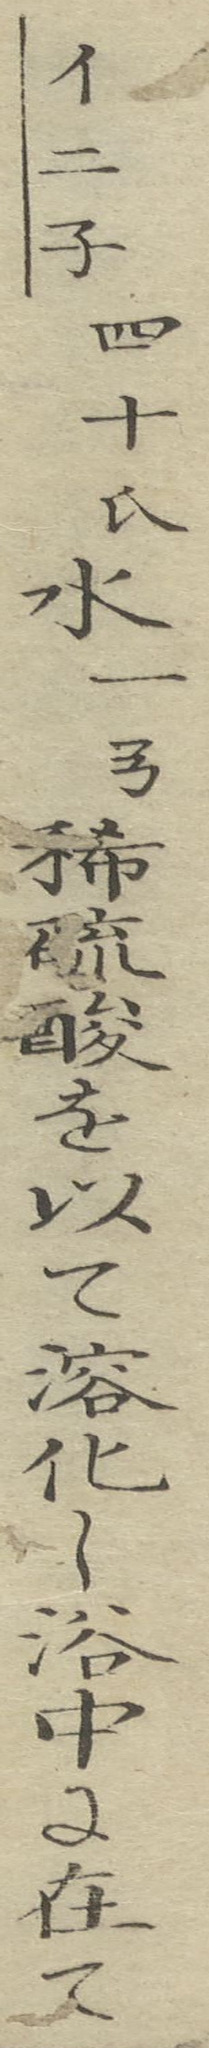イニネ四十勺水一合希硫酸を以て容化し浴中に在て

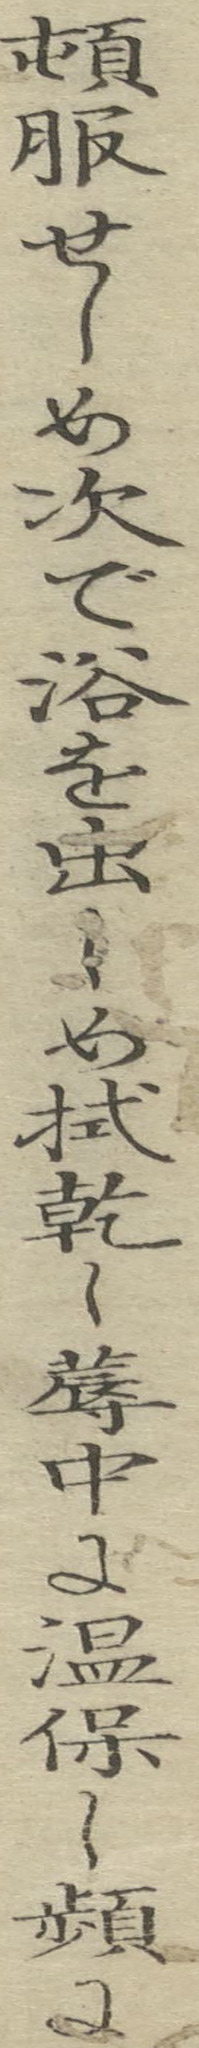頓服せしめ次で浴を出しめ拭乾し褥中に温保し頻に
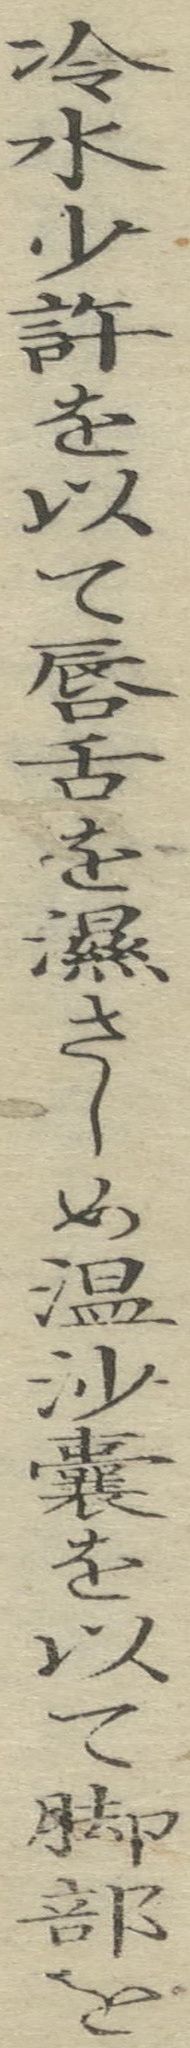冷水少許を以て唇舌を濕さしめ温沙嚢を以て脚を
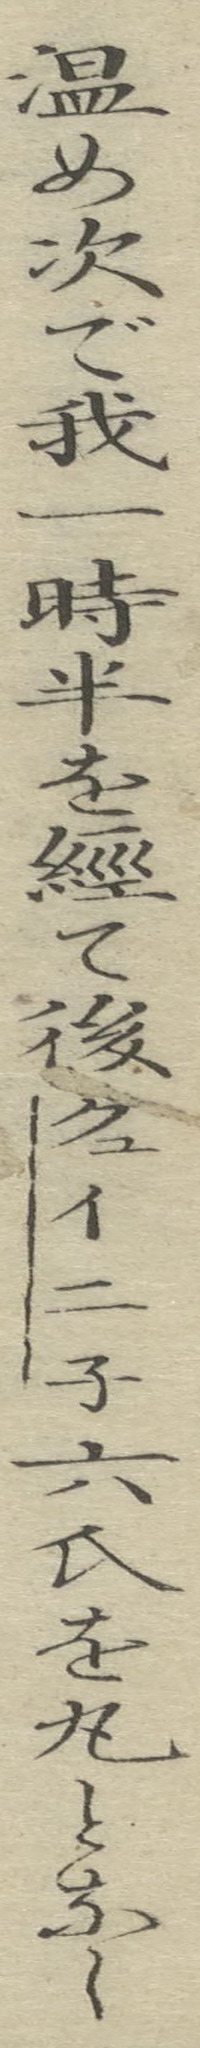温め次で我一時半を経て後クュイニネ六勺を元となし
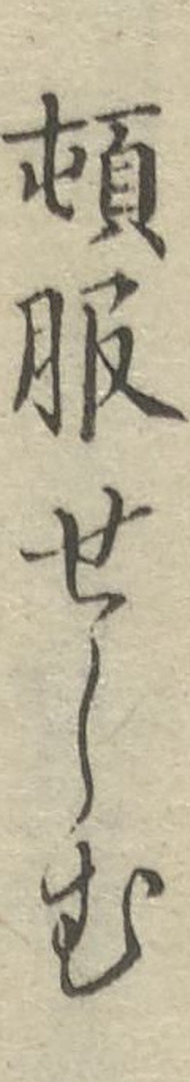頓服せしむ
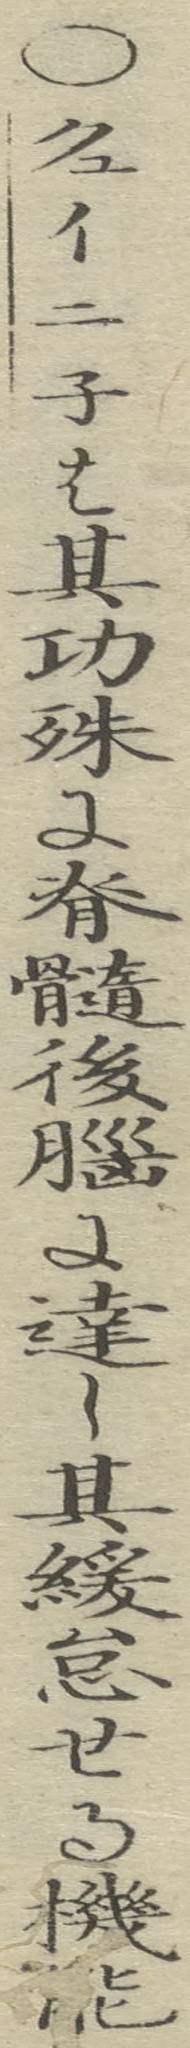〇クュイニネは其功殊に脊髄後脳に達し其緩怠せる機能
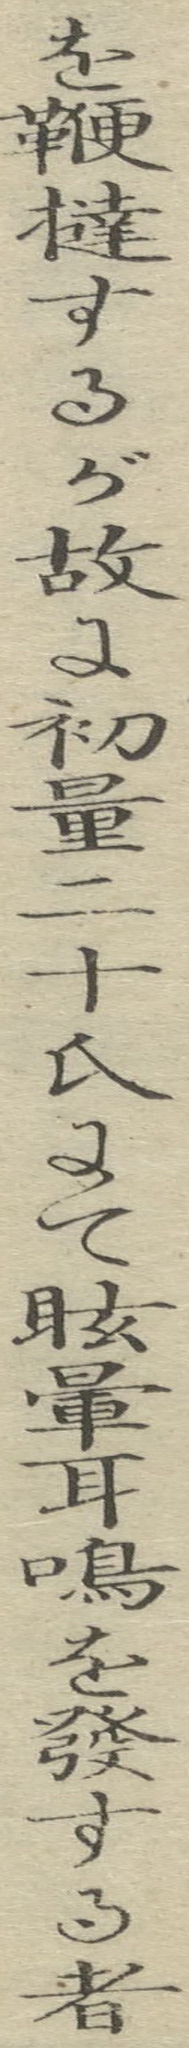を鞭撻するが故に初量二十勺にて眩暈耳鳴を發する者
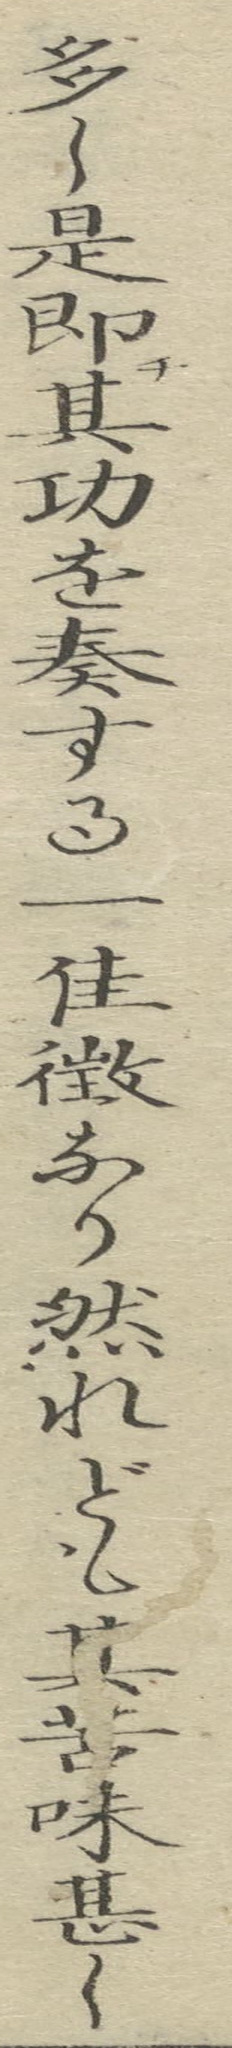多し是即其功を奏する一佳徴なり然れども其苦味甚し
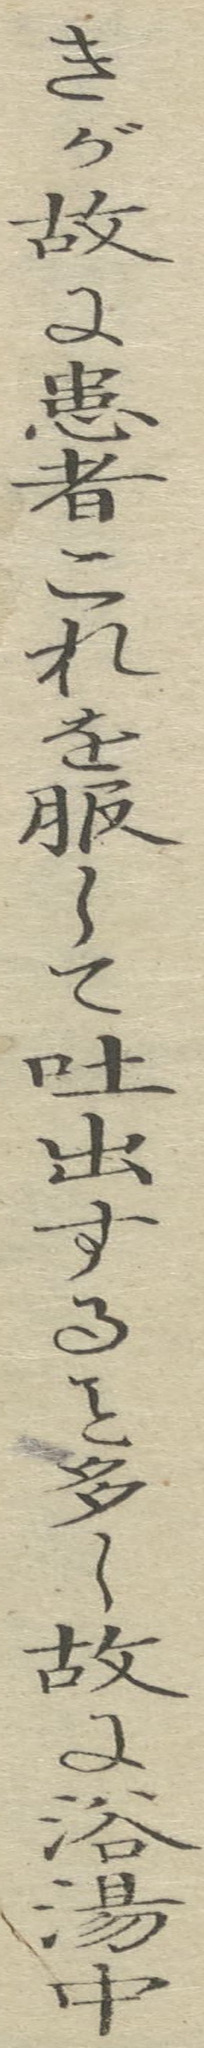きが故に患者これを服して吐出すること多し故に浴場中
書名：官版疫毒預防説　全
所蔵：東京大学総合図書館 General Library in the University of Tokyo, JAPAN
